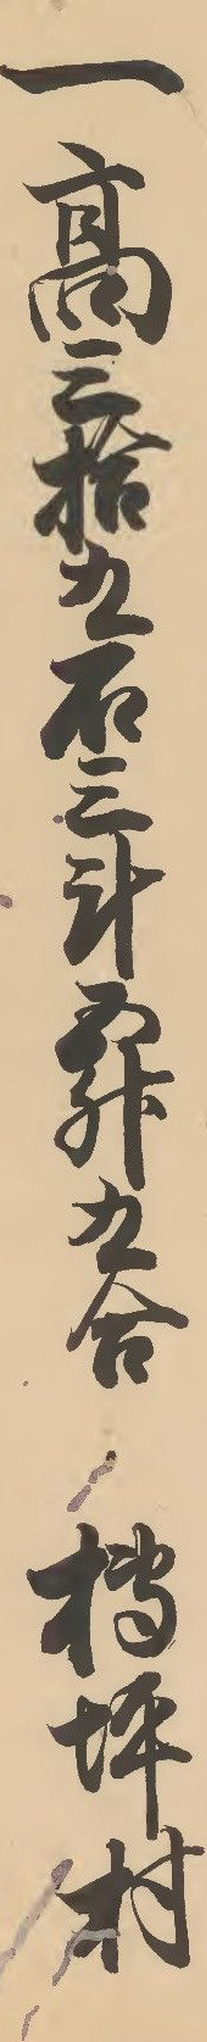一高三拾九石三斗五升九合狩坪村

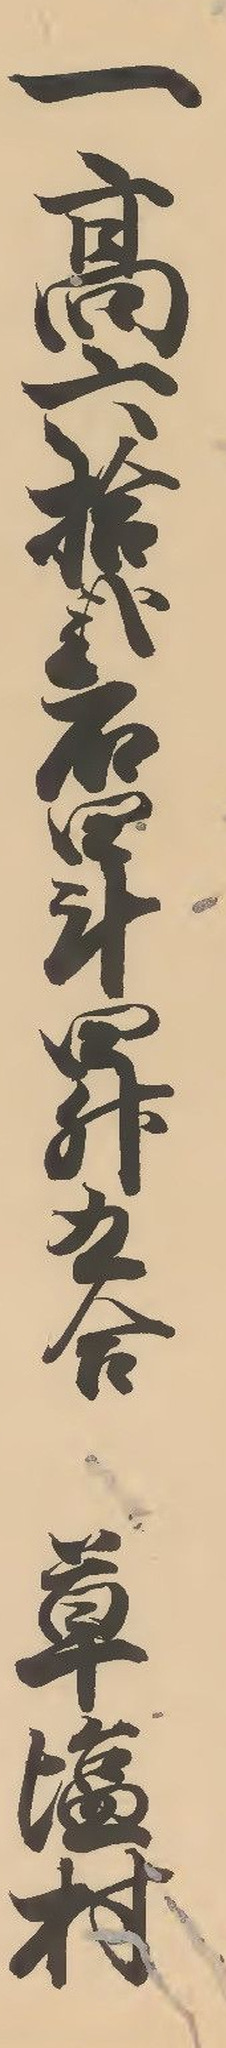一高六拾弐石四斗四升九合草塩村
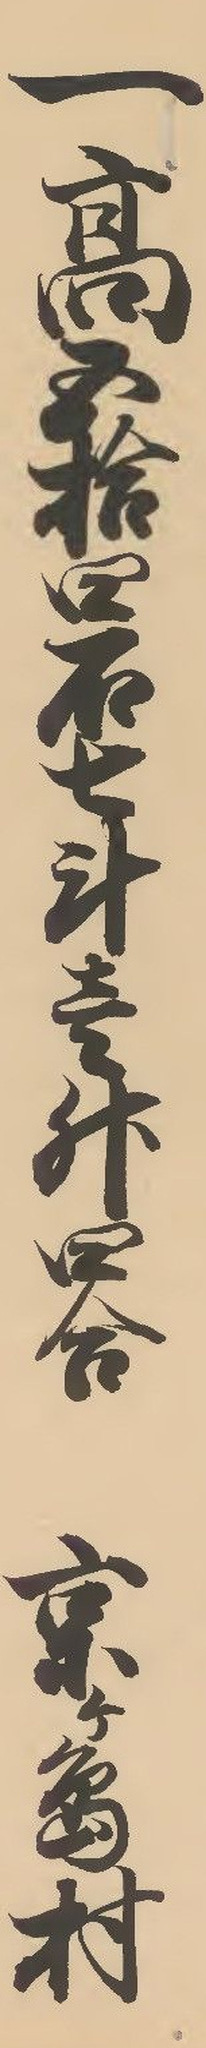一高五拾四石七斗壱升四合京ヶ島村
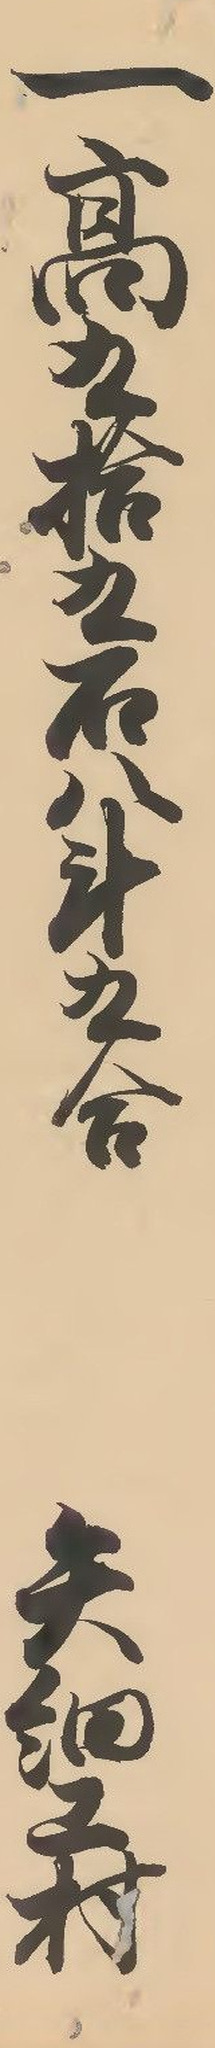一高九拾九石八斗九合矢細工村
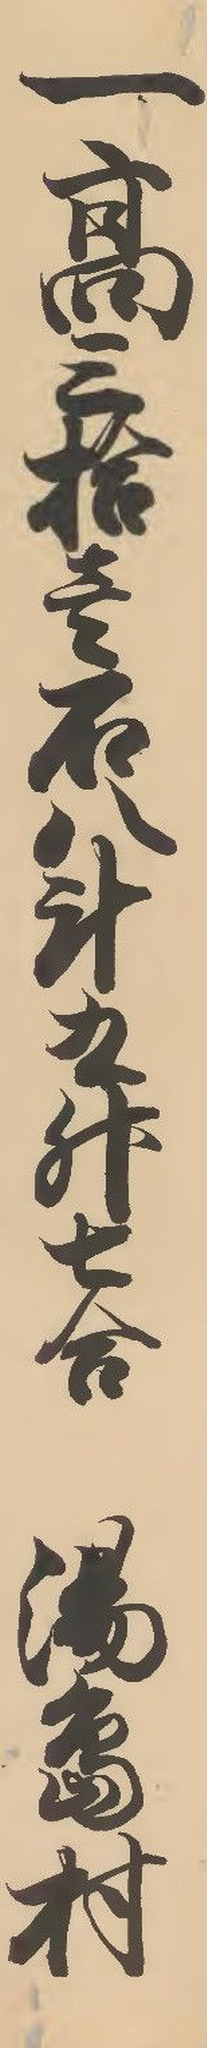一高三拾壱石八斗九升七合湯島村
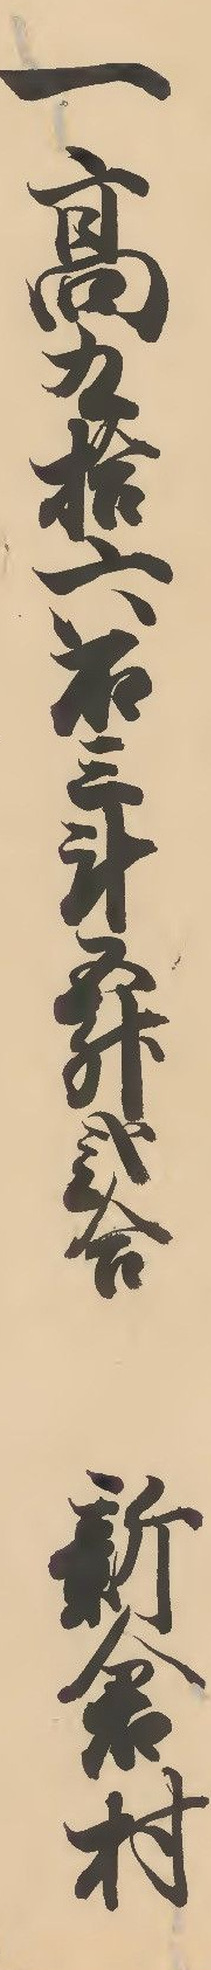一高九拾六石三斗五升弐合新倉村
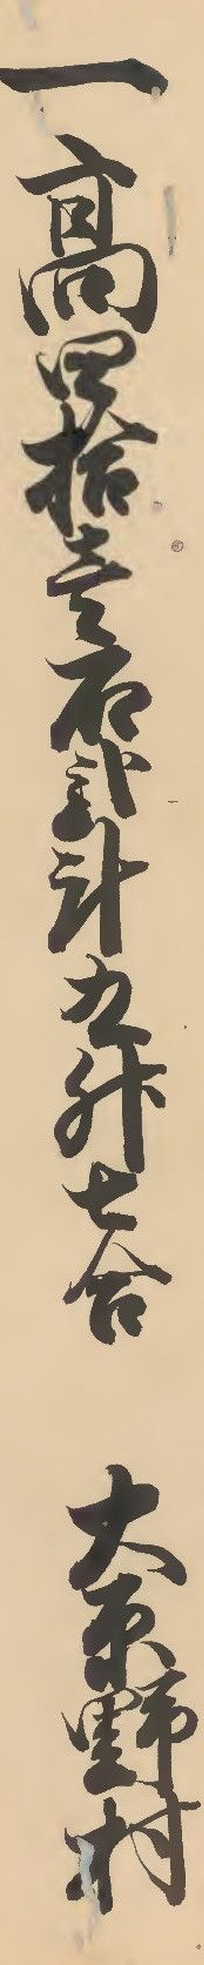一高四拾壱石弐斗九升七合大原野村
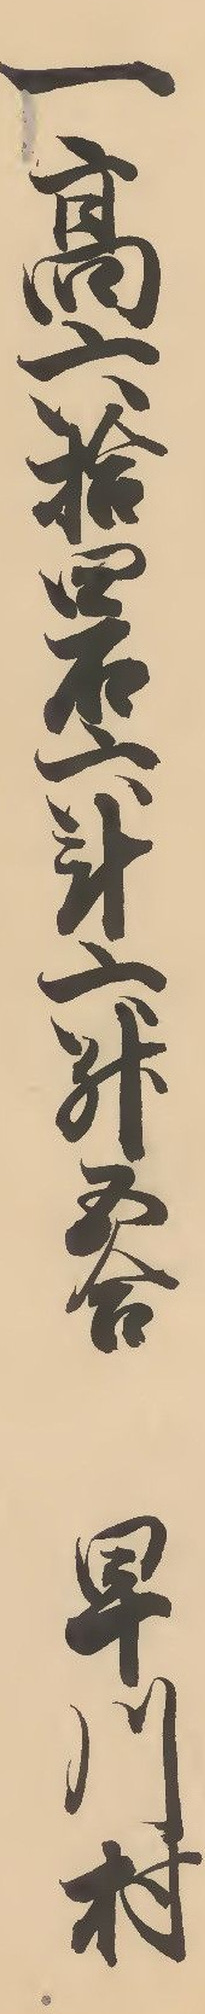一高六拾四石六斗六升五合早川村
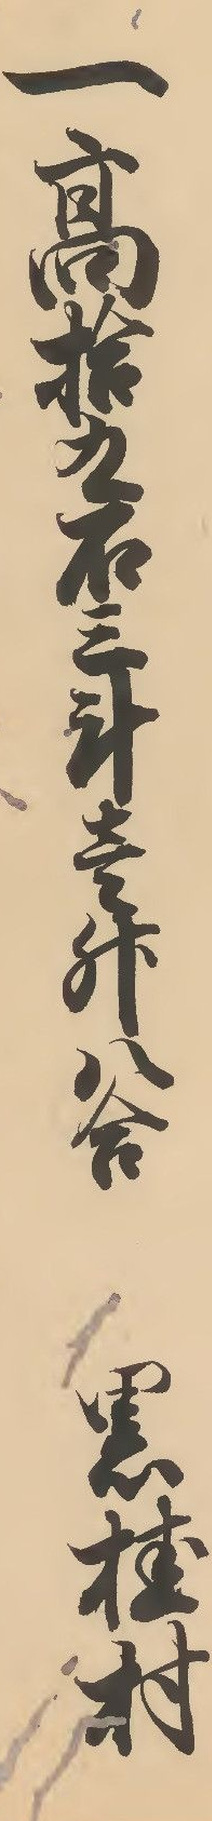一高拾九石三斗壱升八合黒桂村

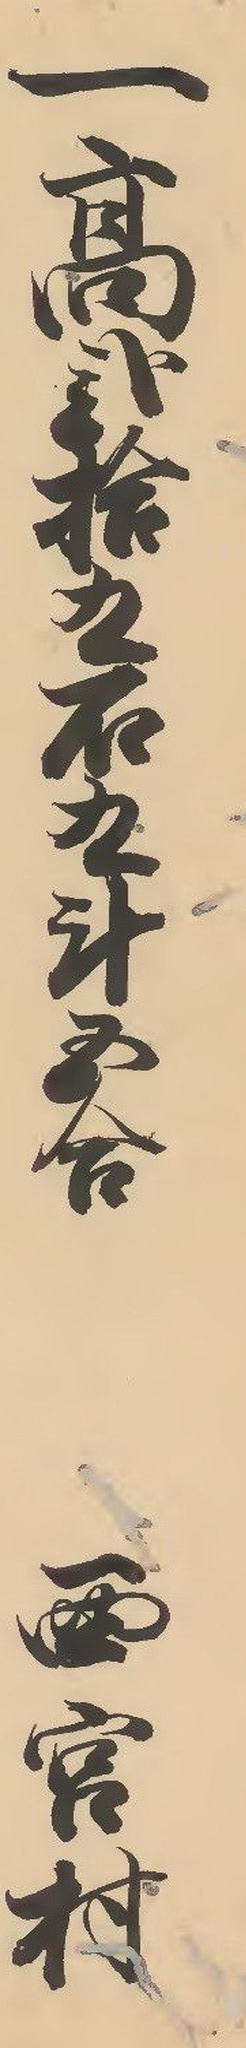一高弐拾九石九斗五合西宮村
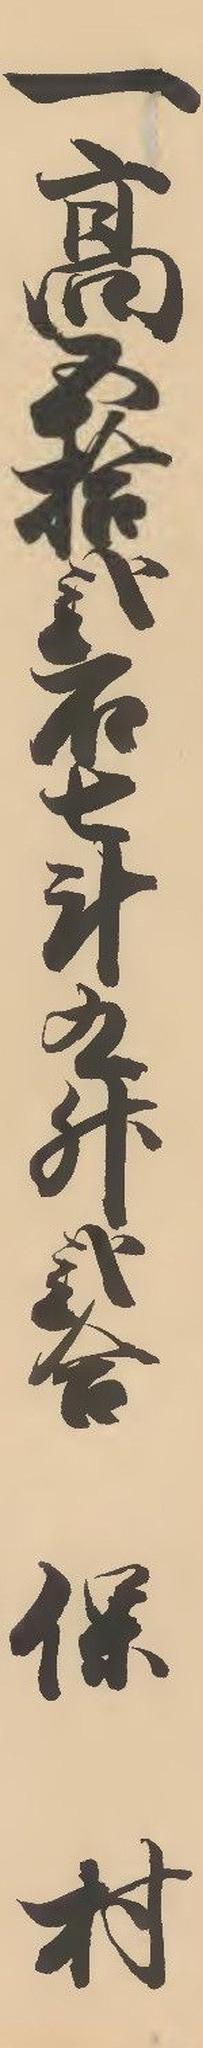一高五拾弐石七斗九升弐合保村
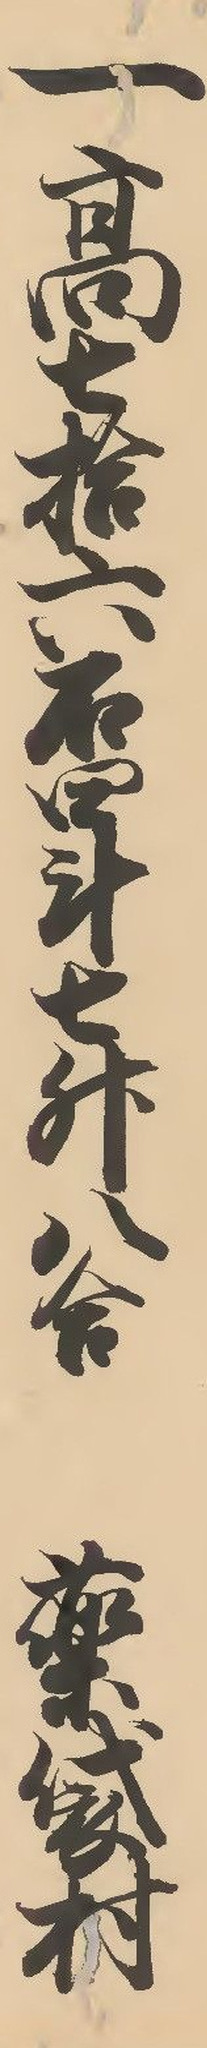一高七拾六石四斗七升八合薬袋村
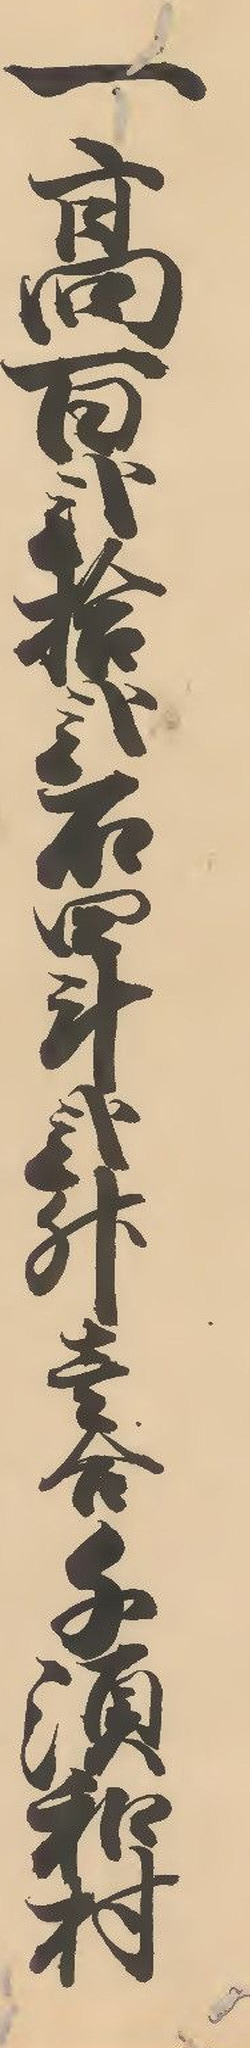一高百弐拾弐石四斗弐升壱合千須和村
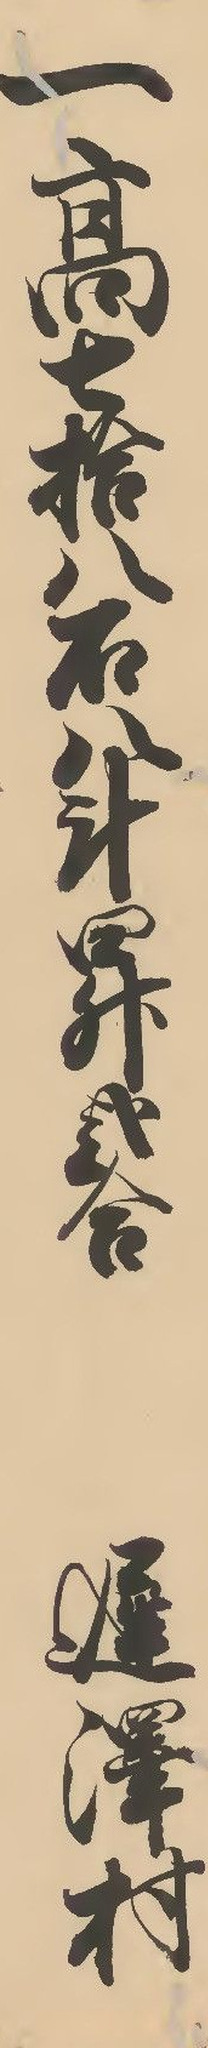一高七拾八石八斗四升弐合遅沢村
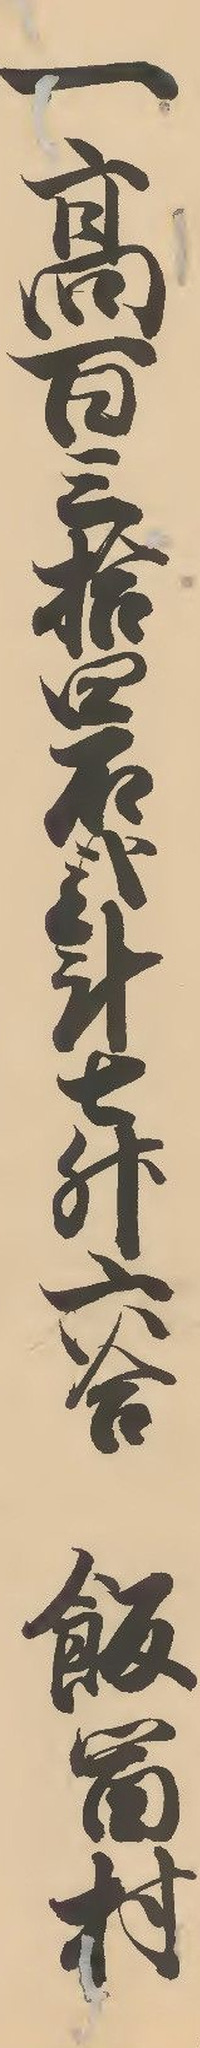一高百三拾四石弐斗七升六合飯富村
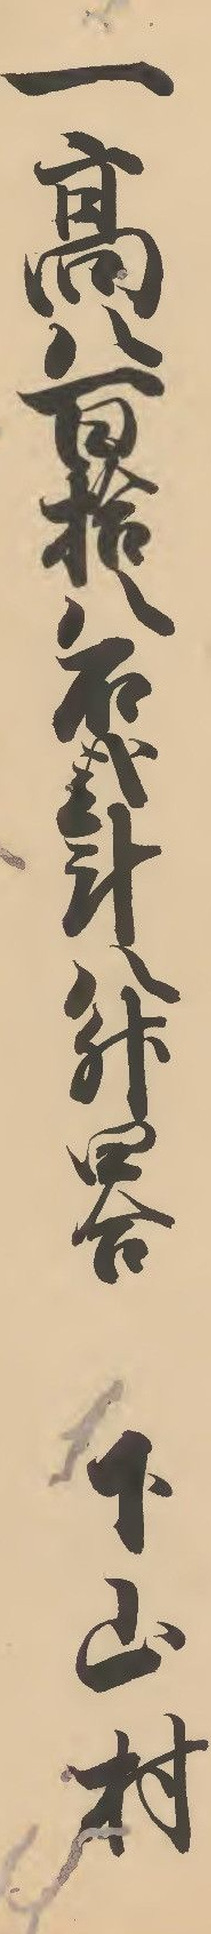一高八百拾八石弐斗八升四合下山村
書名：甲斐国郷帳
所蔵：国立公文書館 National Archives of Japan
